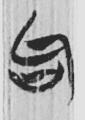句
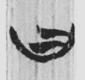曰
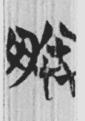朕
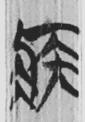疾
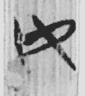女
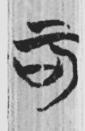可
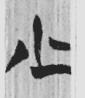少
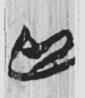臣
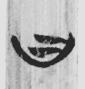曰
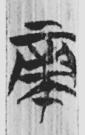帝
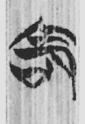命
